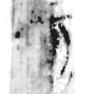可
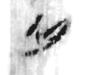㠯
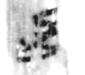西
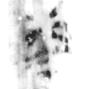南
